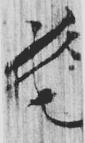民
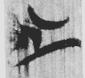之
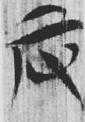反
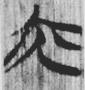亦
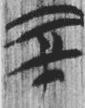不
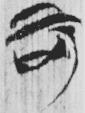可
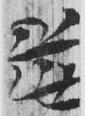志
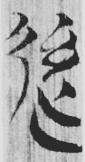後
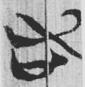右
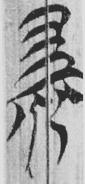耑（端）
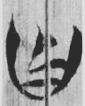曰
